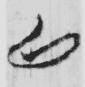㠯（以）
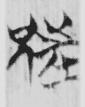{兄之𡈼}
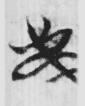弟
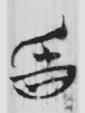昏
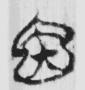因
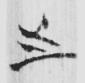之
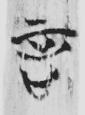言
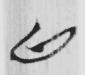㠯（以）
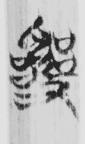{𤔔㗊}
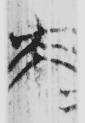夫=
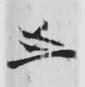之
